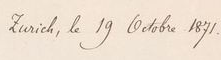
Zurich, le 19 Octobre 1871.
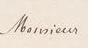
Monsieur
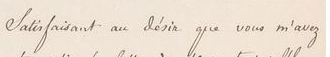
Satisfaisant au désir que vous m'avez
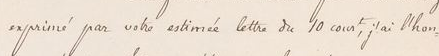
exprimé par votre estimée lettre du 10 court, j'ai l'hon-
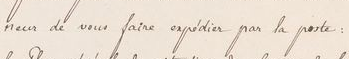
neur de vous faire expédier par la poste:
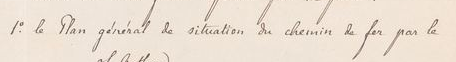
1o le Plan général de situation du chemin de fer par le
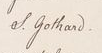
S. Gothard.
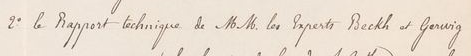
2o le Rapport technique de MM. les Experts Beckh et Gerwig
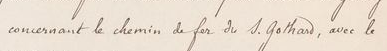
concernant le chemin de fer du S. Gothard, avec le
